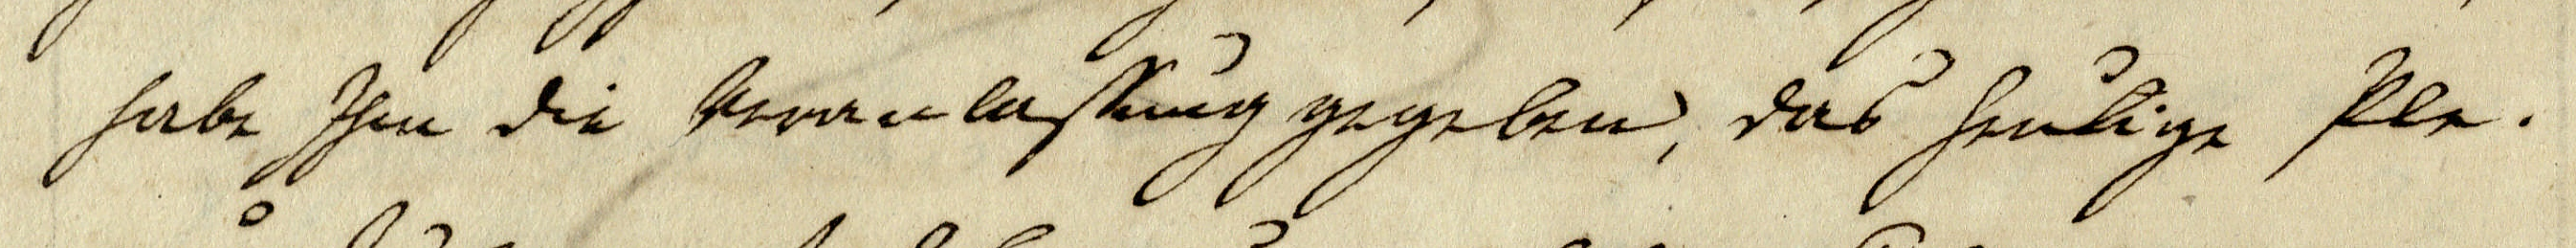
habe Ihm die Veranlassung gegeben, das heutige Ple¬
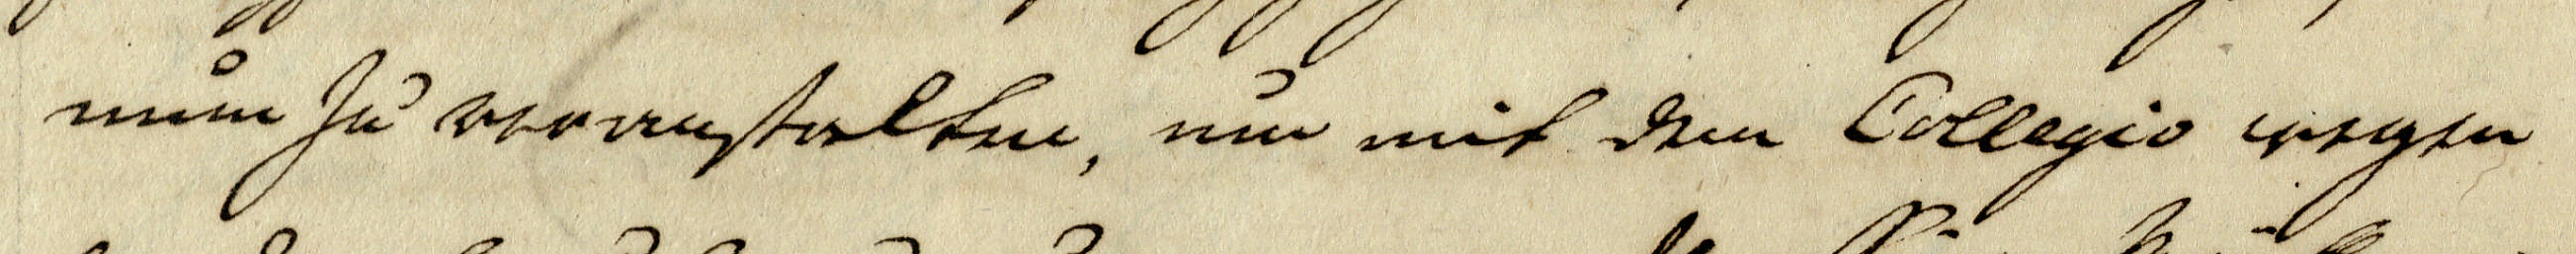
num zu veranstalten, um mit dem Collegio wegen
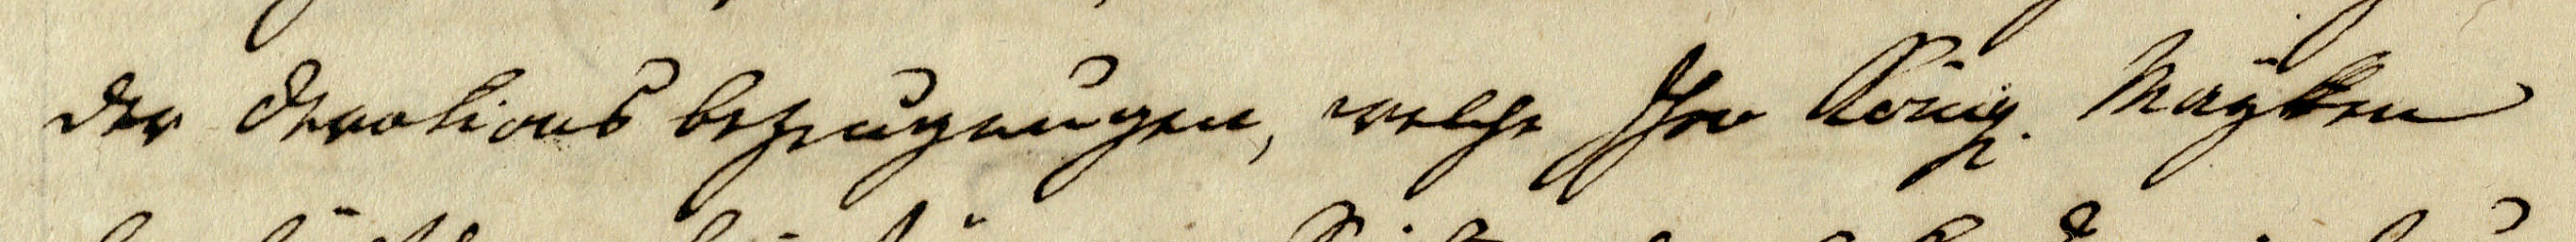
der Devotionsbezeugungen, welche Ihro König. Maÿtten
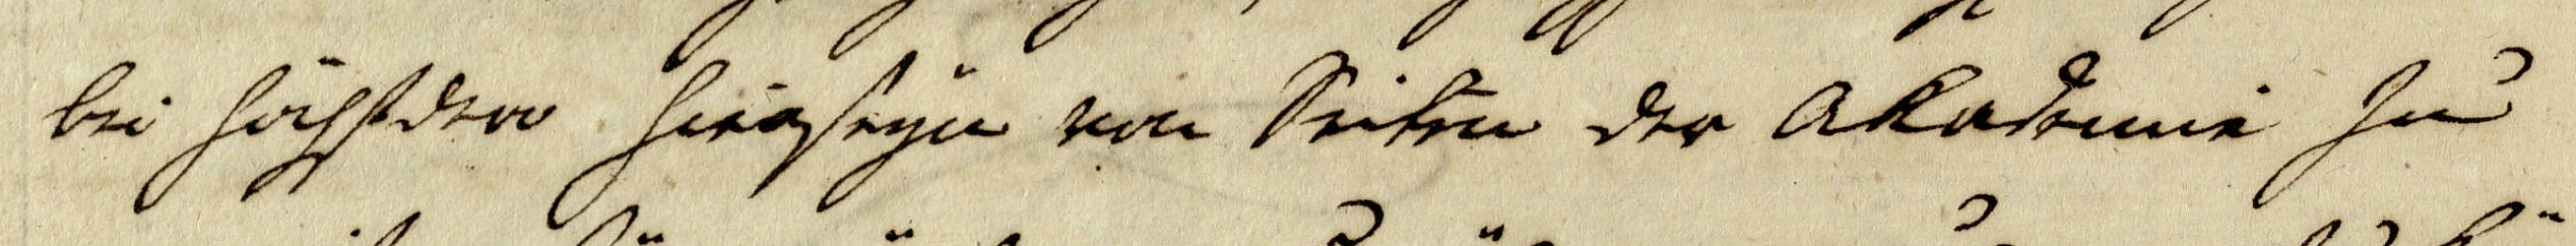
bei höchstdero Hierseÿn von Seiten der Akademie zu
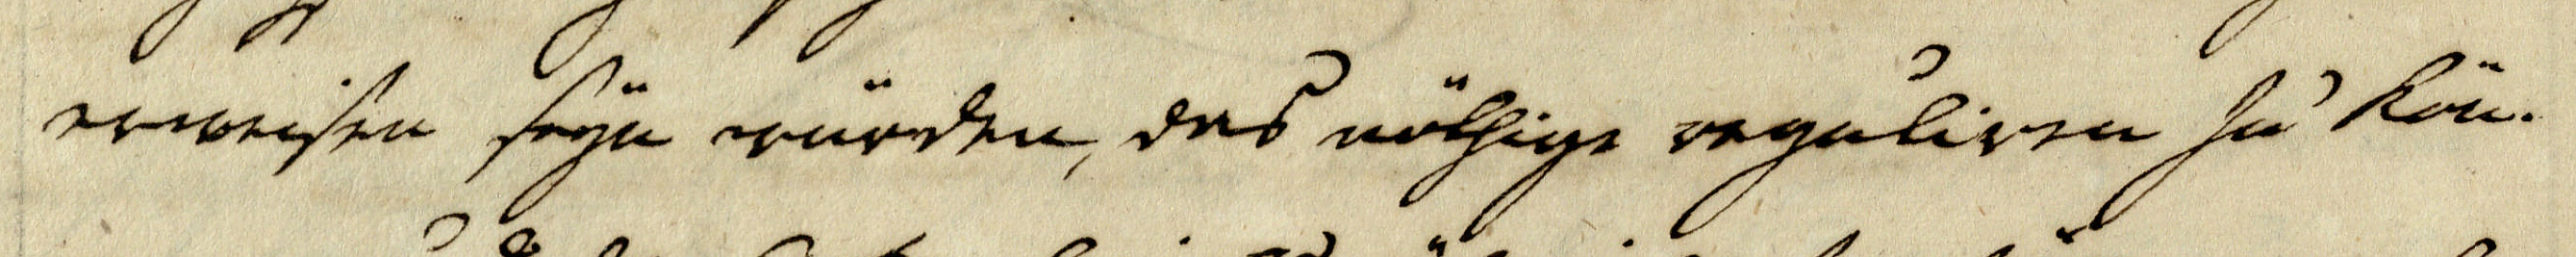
erweisen seÿn würden, das nöthige reguliren zu kön¬
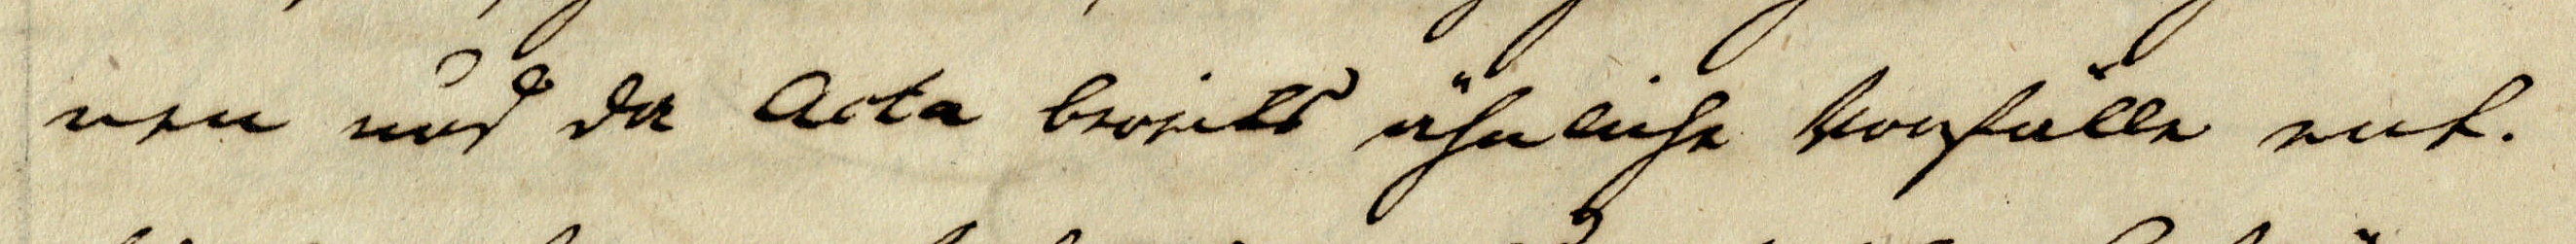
nen und da Acta bereits ähnliche Vorfälle ent¬
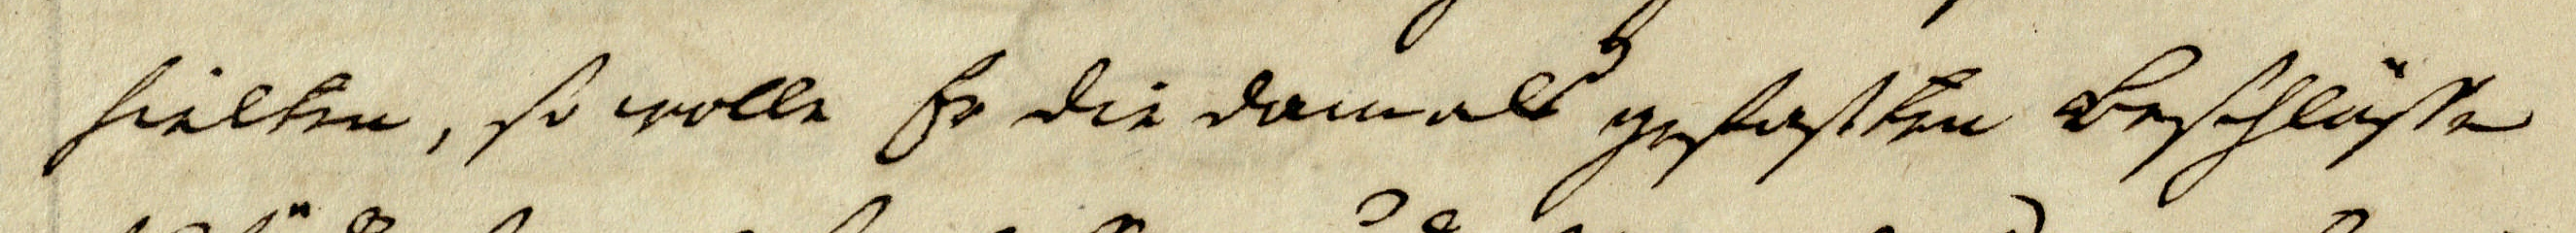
hielten, so wolle Er die damals gefaßten Beschlüsse
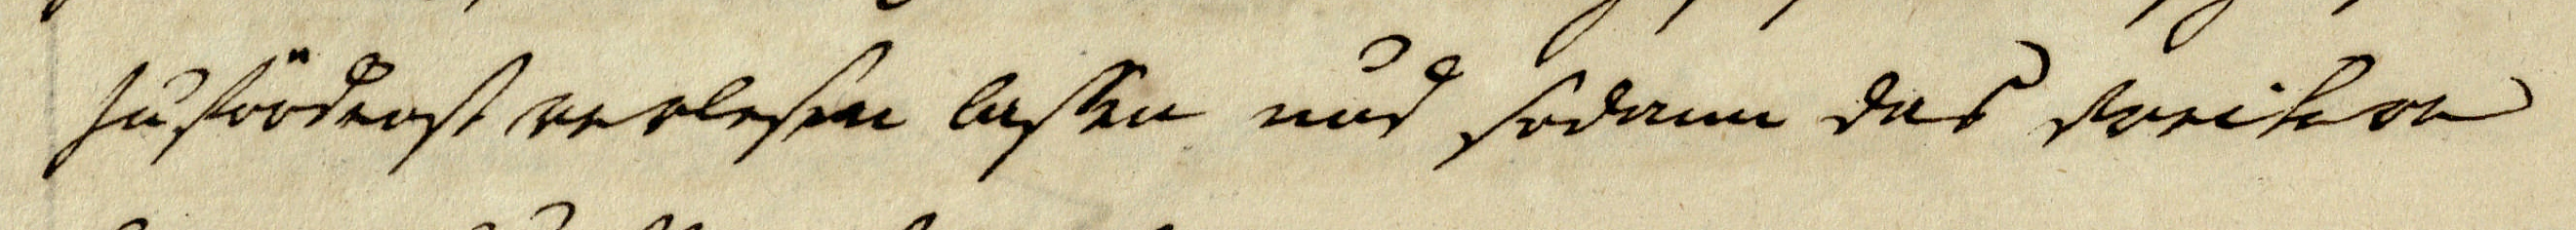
zuförderst verlesen lassen und sodann das weitere
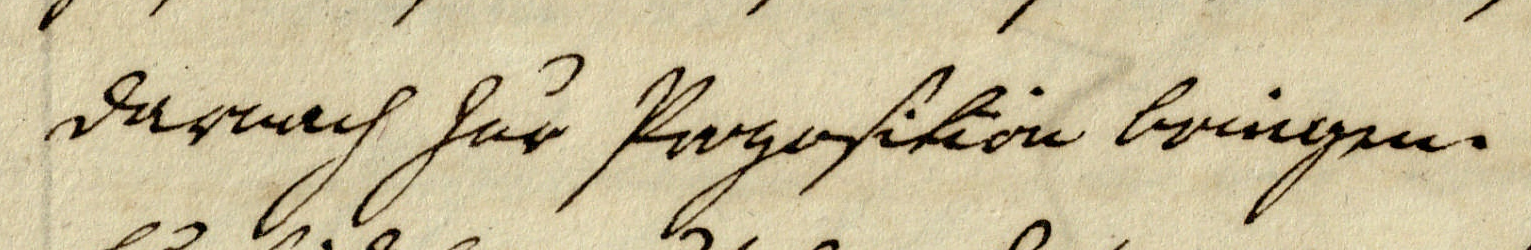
darnach zur Proposition bringen.
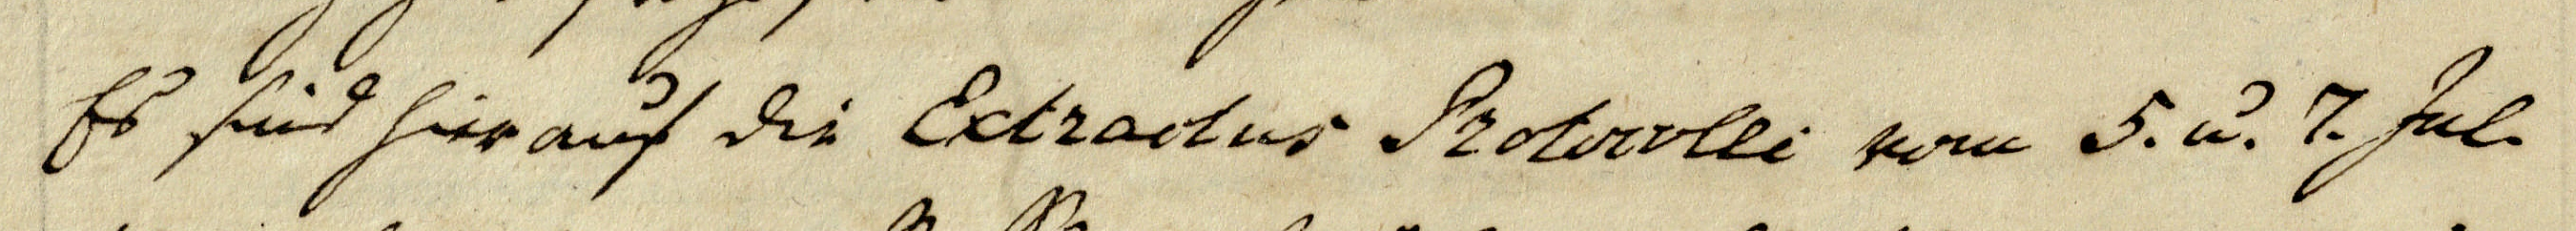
Es sind hierauf die Extractus Protocolli vom 5. u. 7. Jul.
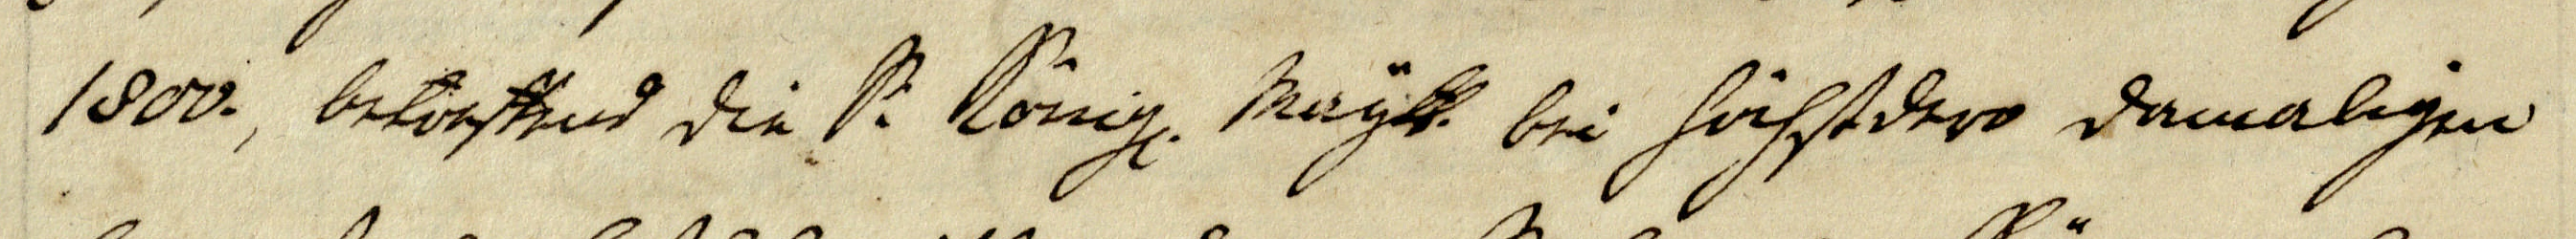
1800., betreffend die Sr Königl. Maÿtt. bei höchstdero damaligen
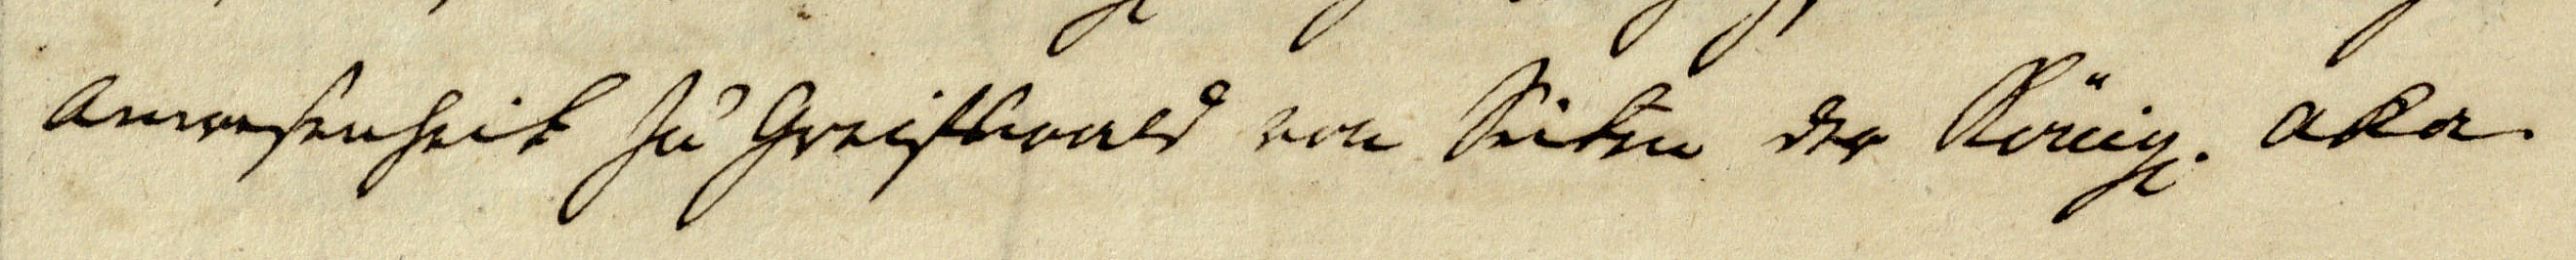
Anwesenheit zu Greifswald von Seiten der Königl. Aka¬
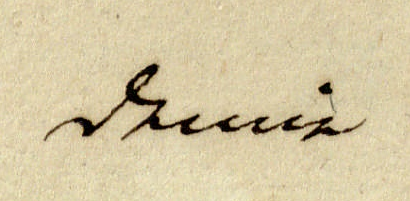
demie
